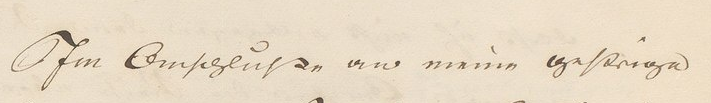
Im Anschluße an meine gestrige
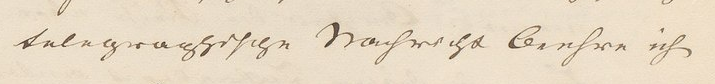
telegraphische Nachricht beehre ich
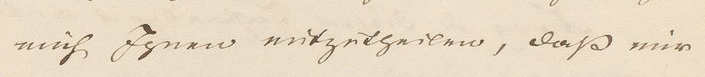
mich Ihnen mitzutheilen, daß mir
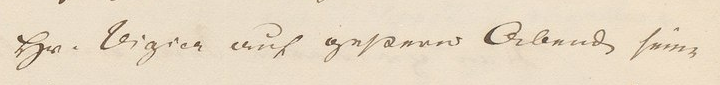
Hr. Vigier auf gestern Abend seine
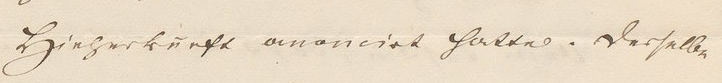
Hieherkunft anoncirt hatte. Derselbe
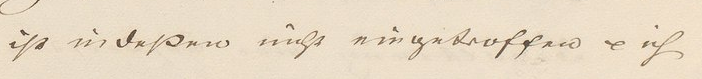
ist indeßen nicht eingetroffen & ich
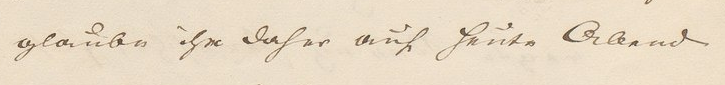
glaube ihn daher auf heute Abend
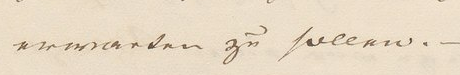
erwarten zu sollen. –
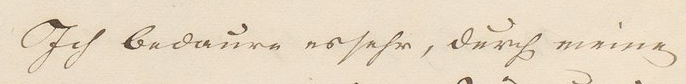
Ich bedaure es sehr, durch meine
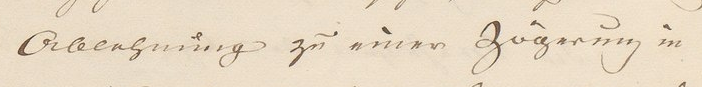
Ablehnung zu einer Zögerung in
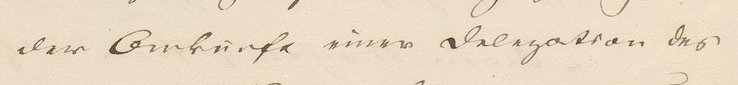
der Ankunft einer Delegation des
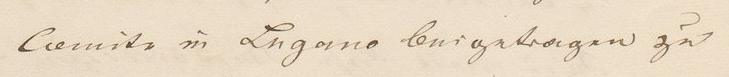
Comite in Lugano beigetragen zu
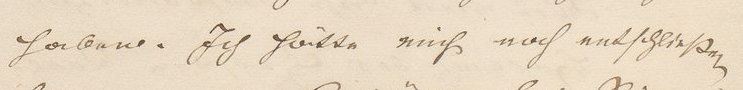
haben. Ich hätte mich noch entschließen
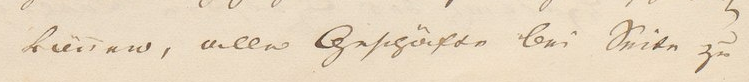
können, alle Geschäfte bei Seite zu
